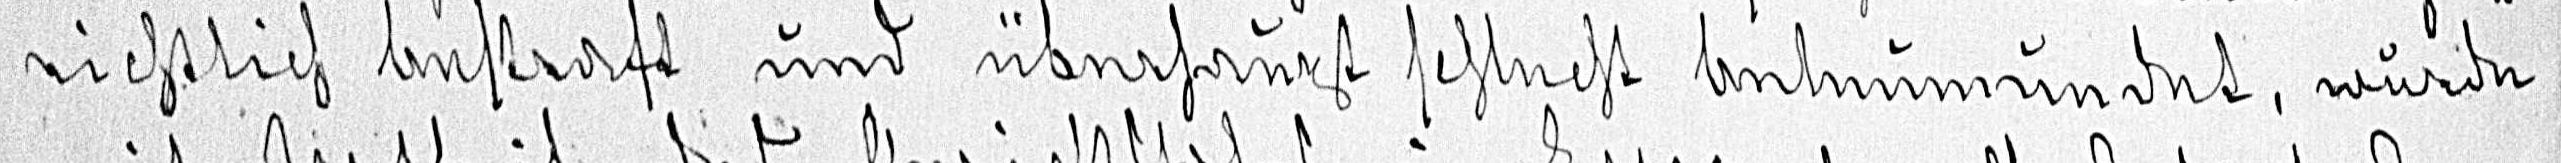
richtlich bestraft und überhaupt schlecht beleumundet, wurde
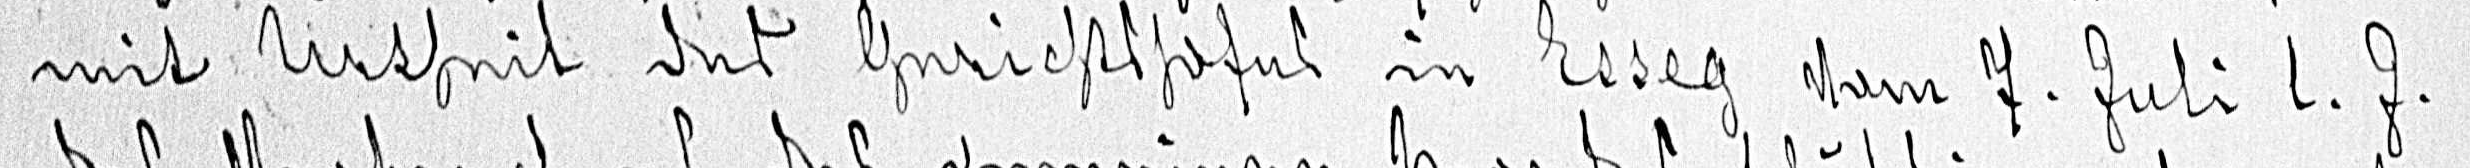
mit Urtheil des Gerichtshofes in Esseg vom 7. Juli l. J.
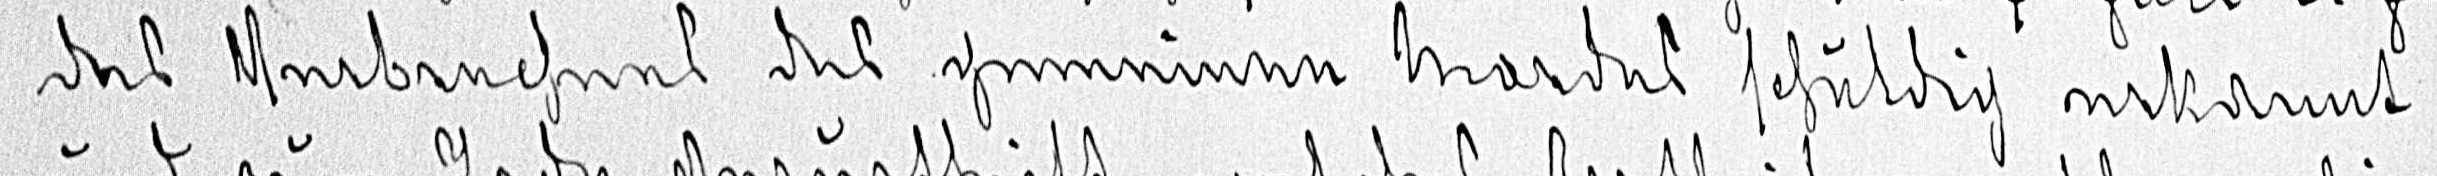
des Verbrechens des gemeinen Mordes schuldig erkannt
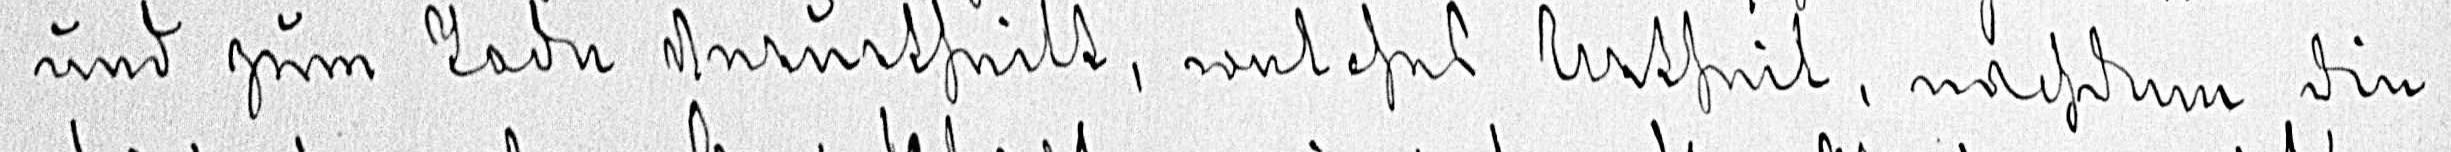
und zum Tode verurtheilt, welches Urtheil, nachdem die
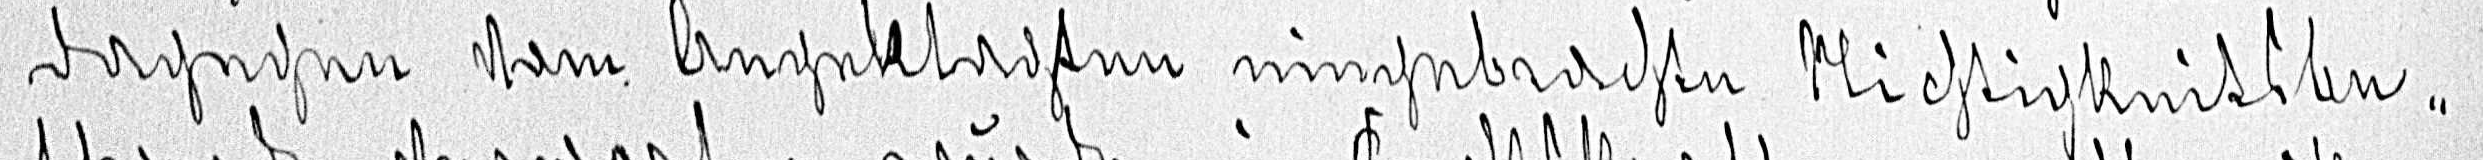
dagegen vom Angeklagten eingebrachte Nichtigkeitsbe¬
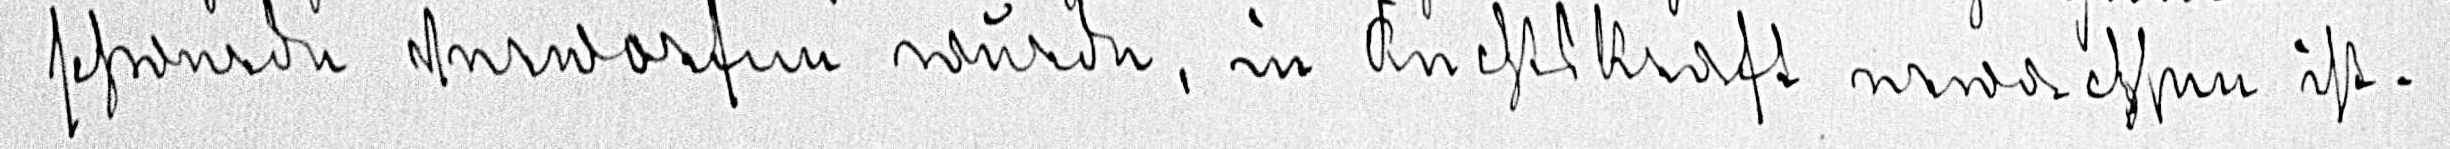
schwerde verworfen wurde, in Rechtskraft erwachsen ist.
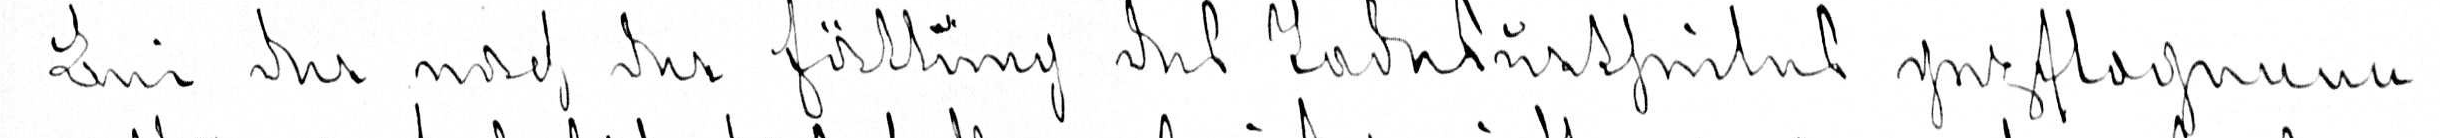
Bei der nach der Fällung des Todesurtheiles gepflogenen
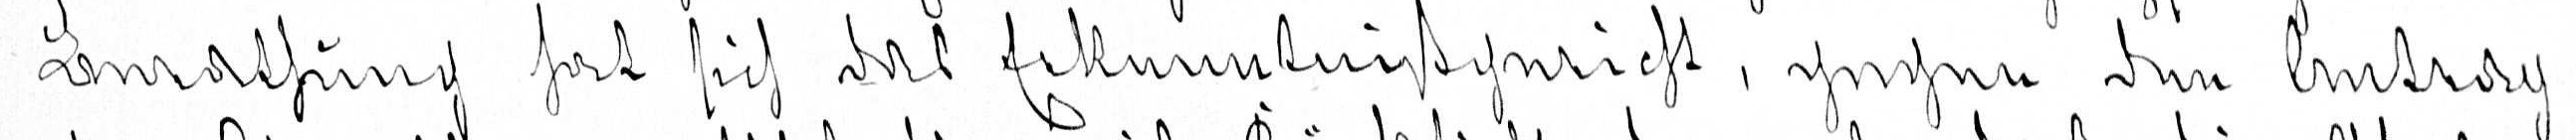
Berathung hat sich das Erkenntnißgericht, gegen den Antrag
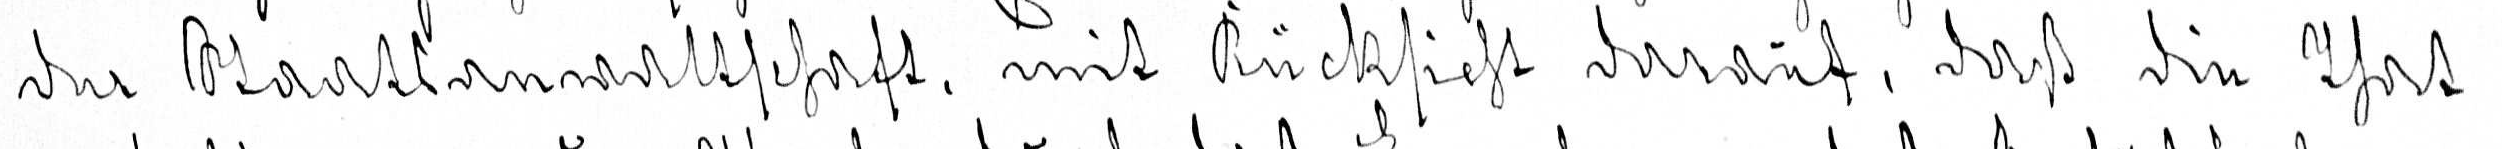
der Staatsanwaltschaft, mit Rücksicht darauf, daß die That
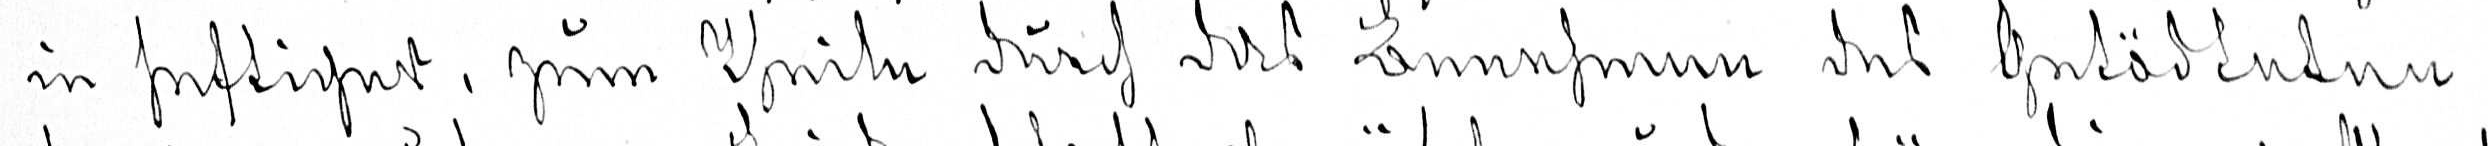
in heftiger, zum Theile durch das Benehmen des Getödteten
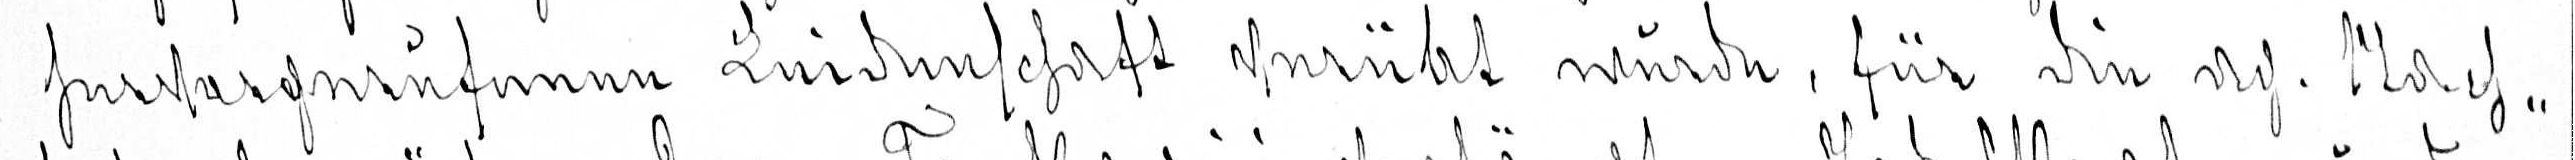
hervorgerufenen Leidenschaft verübt wurde, für die ag. Nach¬
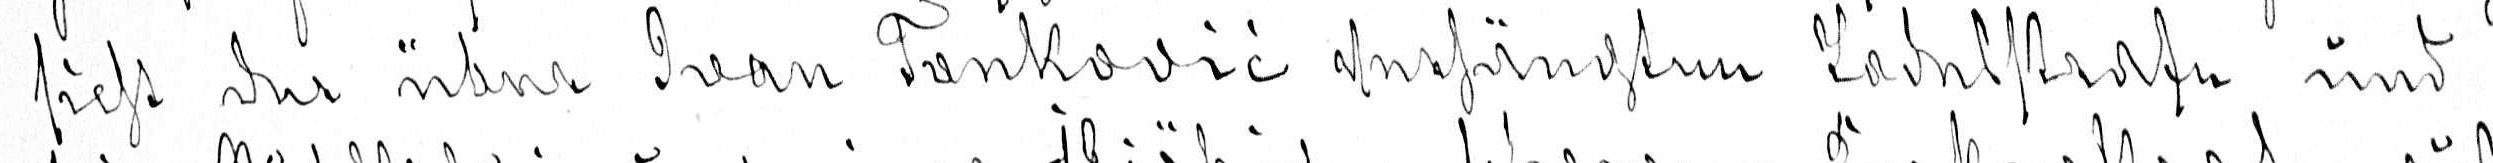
sicht der über Ivan Tonković verhängten Todesstrafe
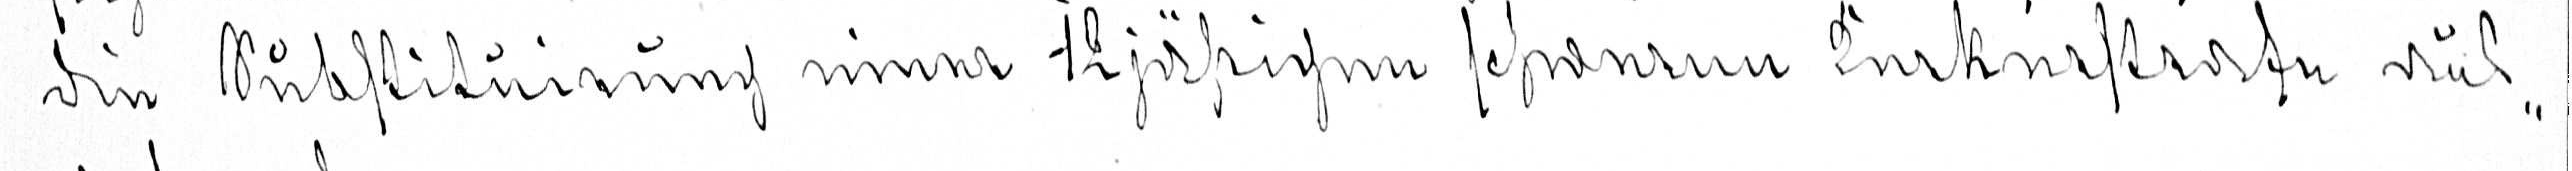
die Substituirung eine 12jähigen schweren kerknestrafe aus¬
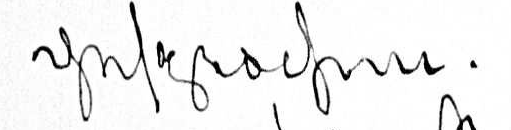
gesprochen.
